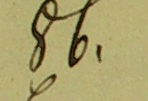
86
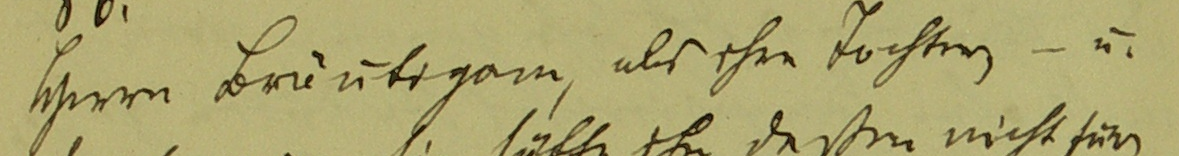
ihren Bräutigam, als ihre Tochter - und
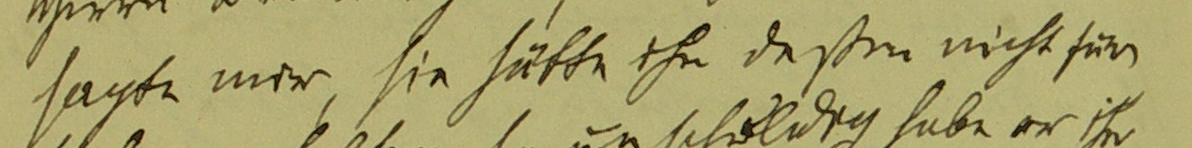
sagte mir , sie hätte ihn deßen nicht für
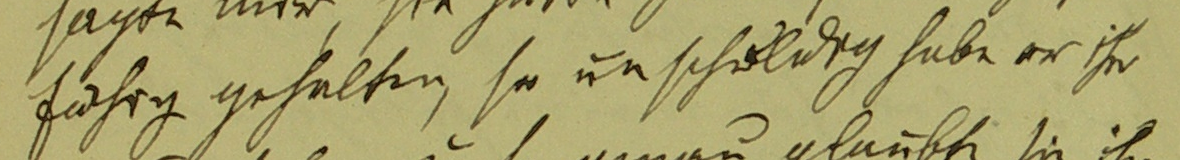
fähig gehalten so unschuldig habe er ihr
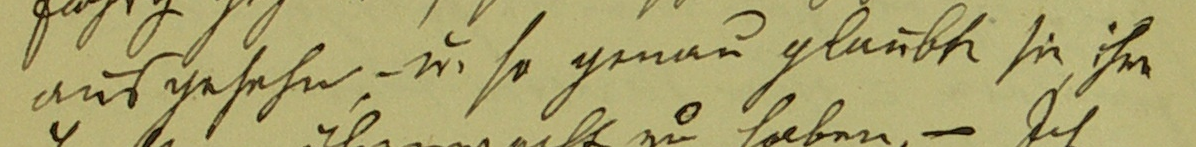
ausgesehen und so genau glaubte sie ihre
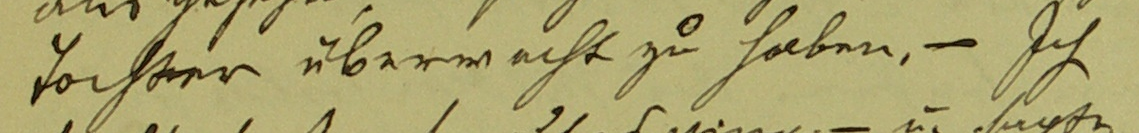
Tochter überwacht zu haben.-Ich
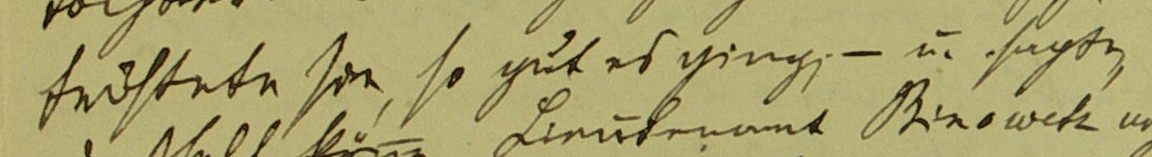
tröstete sie so gut es ging –und sagte
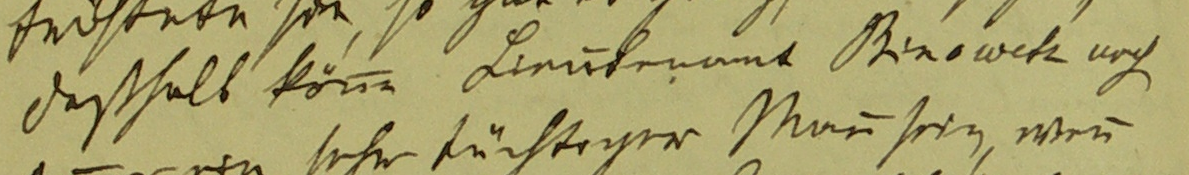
deßhalb könne Lieutenant Binowek noch
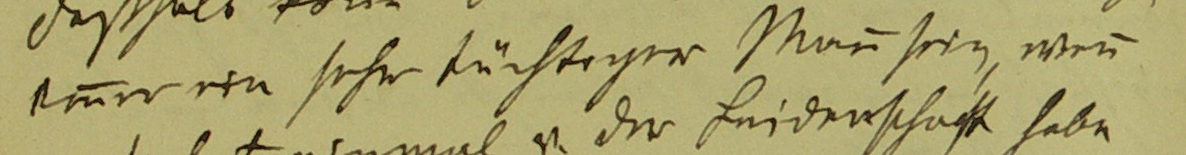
immer ein sehr tüchtiger Mann sein, wenn
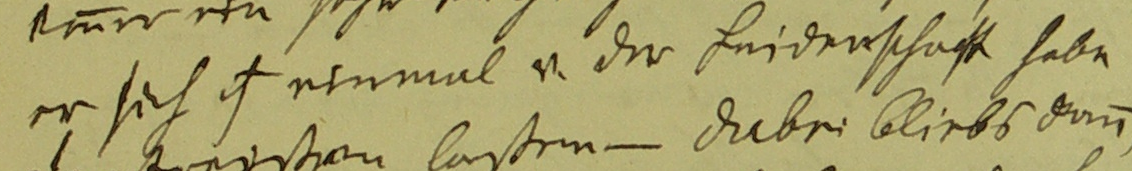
er sich auch einmal von der Leidenschaft habe
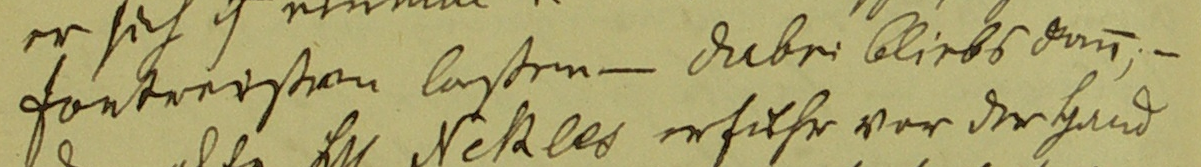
fortreißen lassen.- dabei blieb‘s dann.
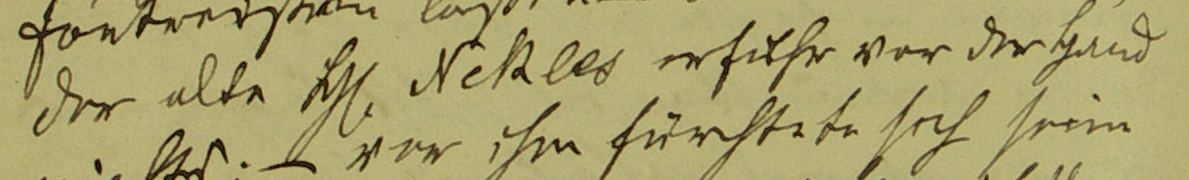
Der alte H. Nekles erfuhr vor der Hand
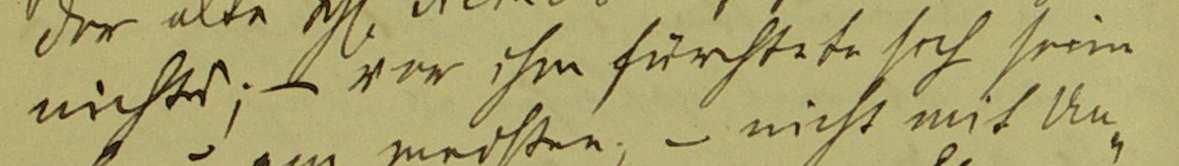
nichts.- vor ihm fürchtete sich seine
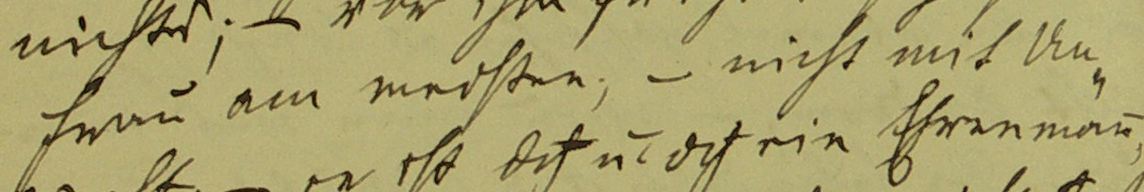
Frau am meisten.-nicht mit Un¬
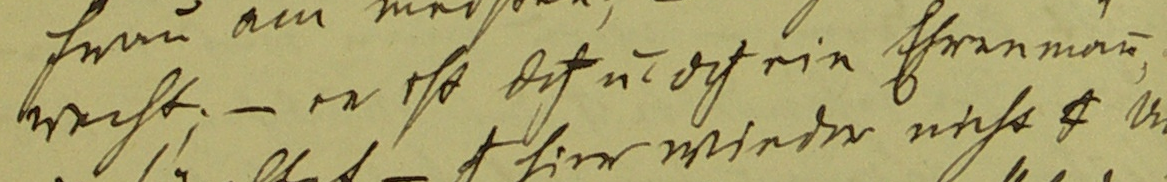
recht, - er ist durch und durch ein Ehrenmann
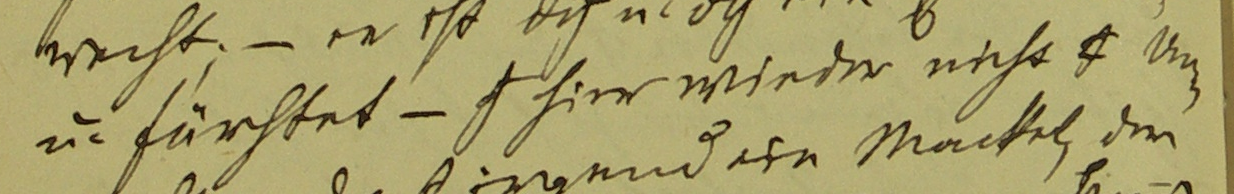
und fürchtet, - auch hier wieder nicht mit Un¬
